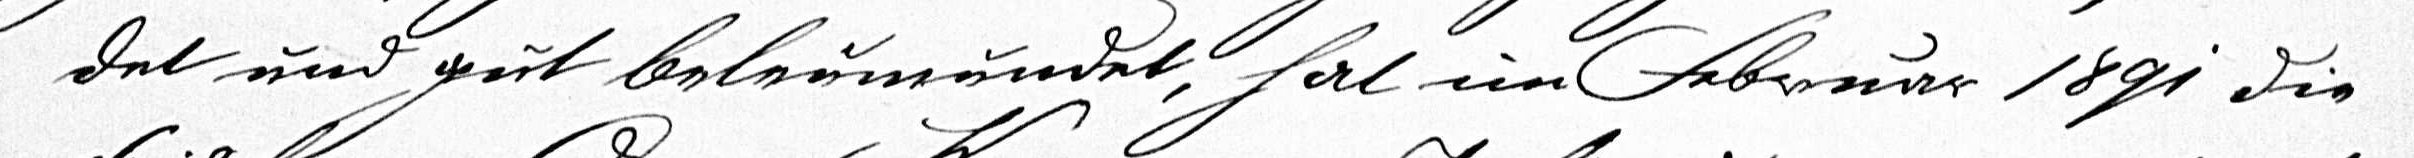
det und gut beleumundet, hat im Februar 1891 die
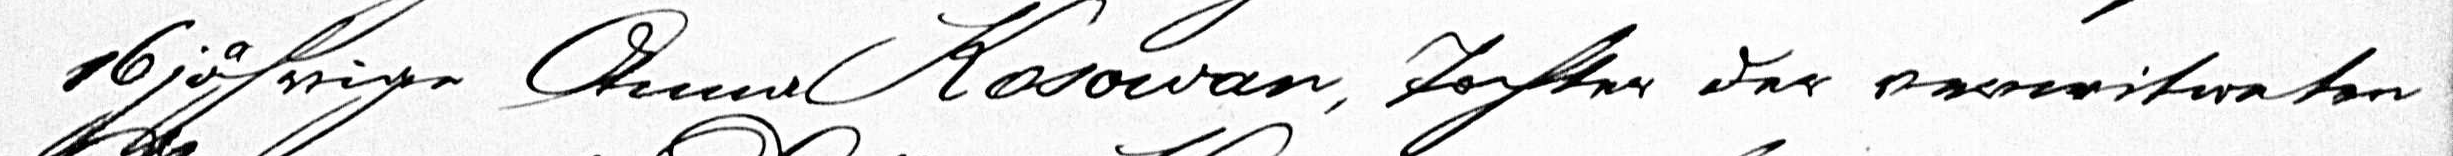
16jährige Anna Kosowan, Tochter der erweiterten
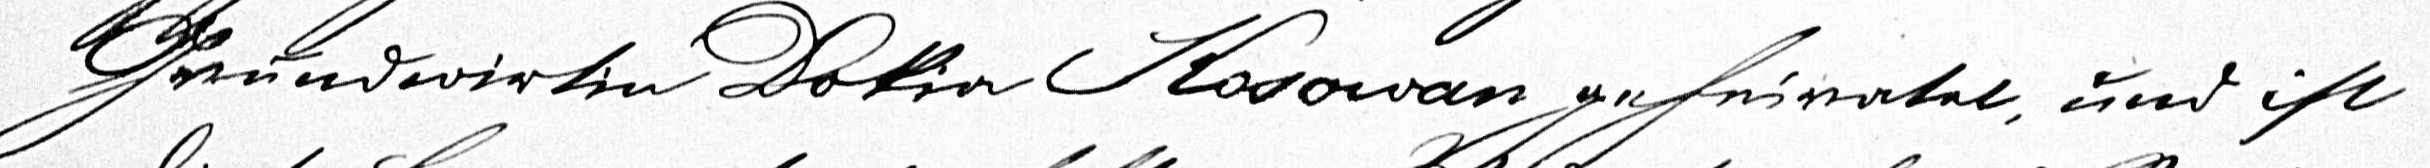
Grundwirtin Dokia Kosowan geheiratet, und ist
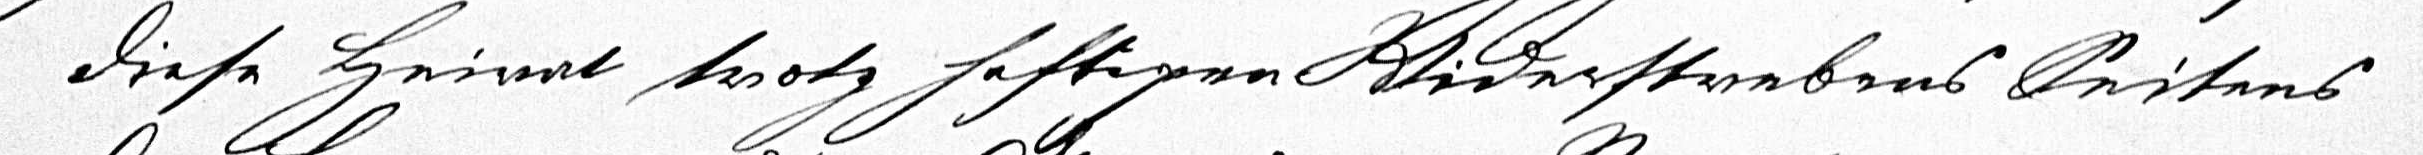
diese Heirat trotz heftigen Widerstrebens Seitens
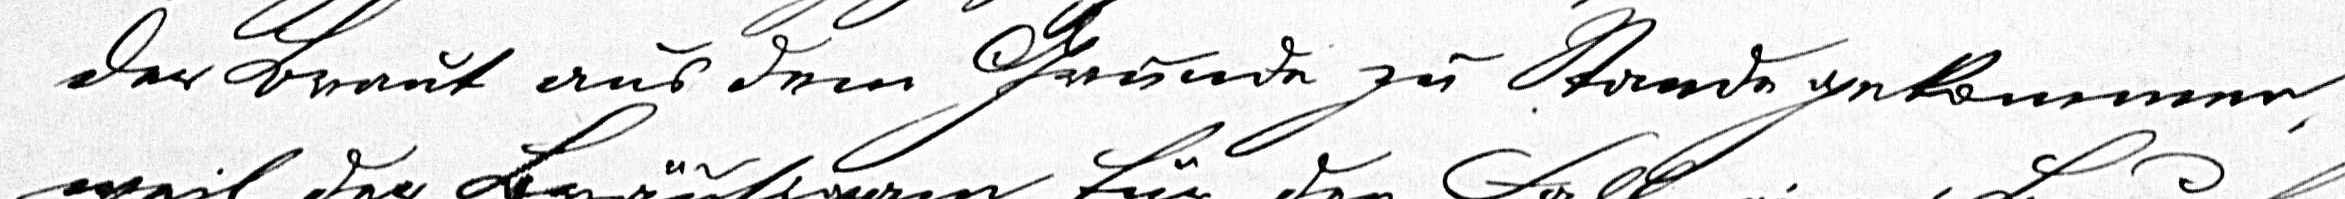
der Braut aus dem Grunde zu Stande gekommen,
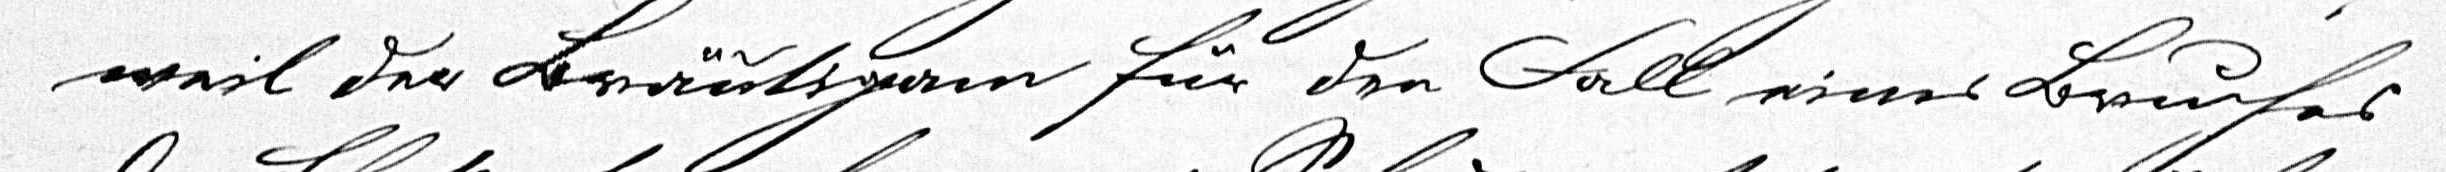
weil der Bräutigam für den Fall eines Bruches
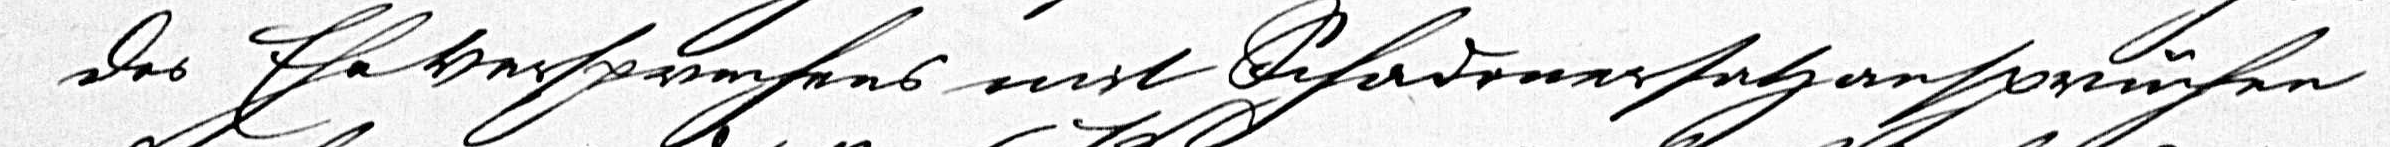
des Eheversprechens mit Schadenersatz ansprüchen
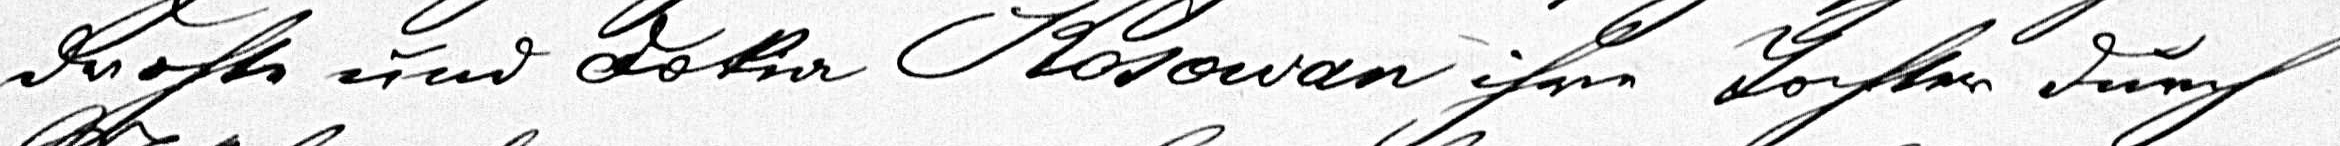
drohte und Dokia Kosowan ihre Tochter durch
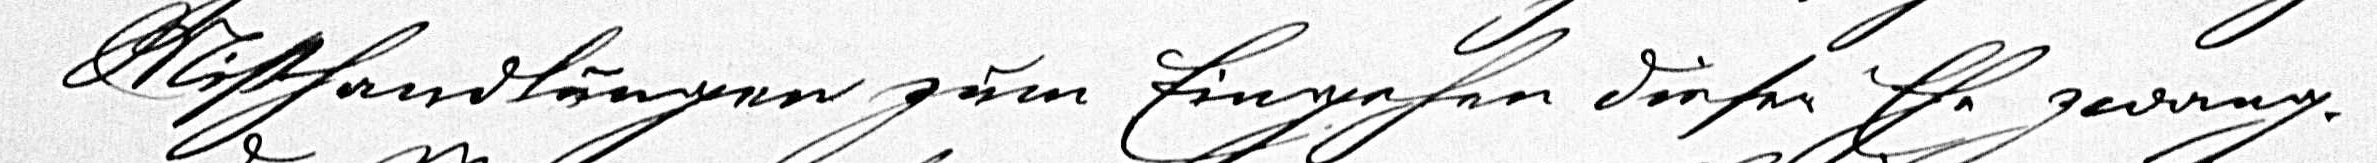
Mißhandlungen zum Eingehen dieser Ehe zwang.
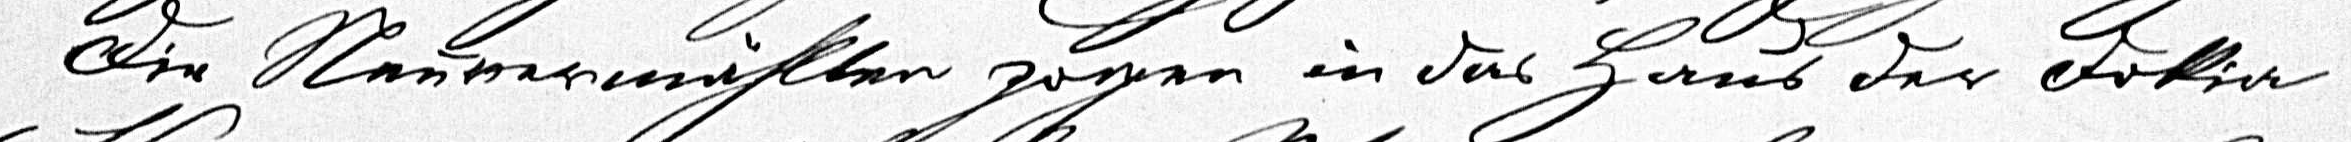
Die Neuvermählten zogen in das Haus der Dokia
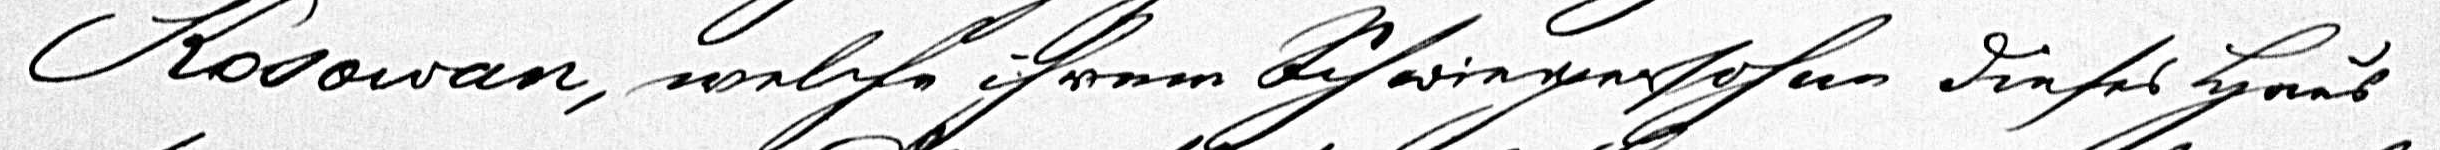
Kosowan, welche ihrem Schwiegersohne dieses Haus
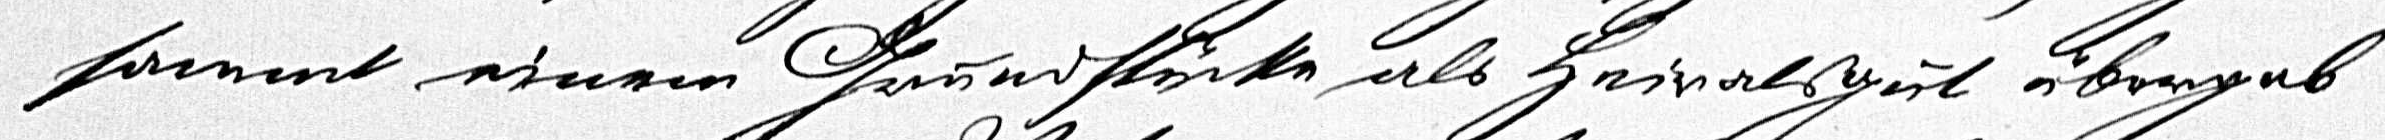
sammt einem Grundstücke als Heiratsgut übergab
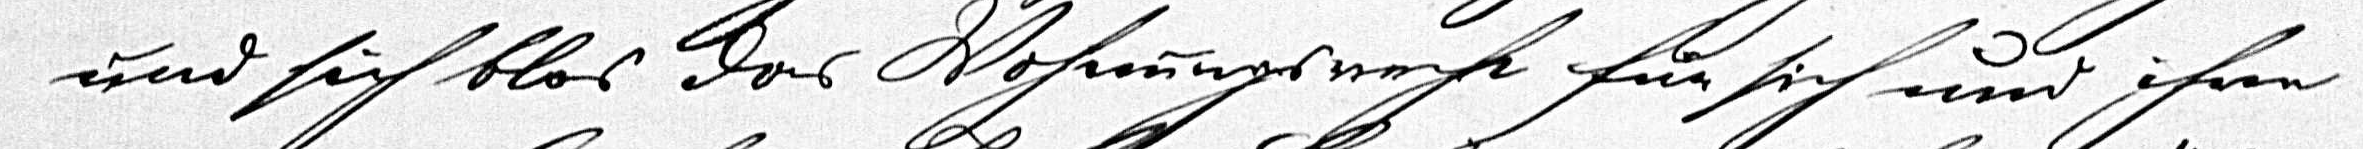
und sich blos das Wohnungsrecht für sich und ihre
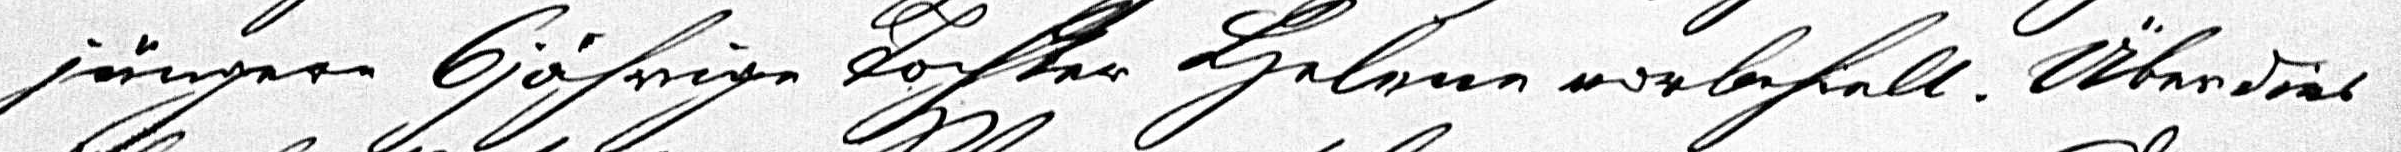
jüngere 6jährige Tochter Helena vorbehielt. Überdies
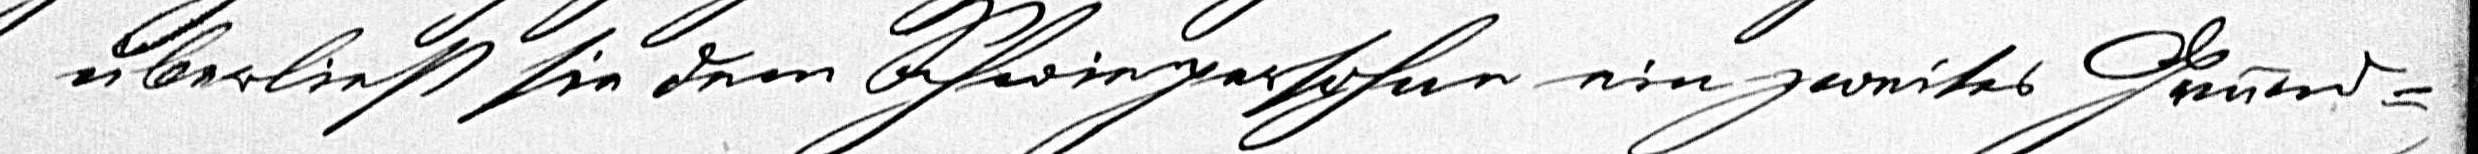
überließ sie dem Schwiegersohne ein zweites Grund¬
